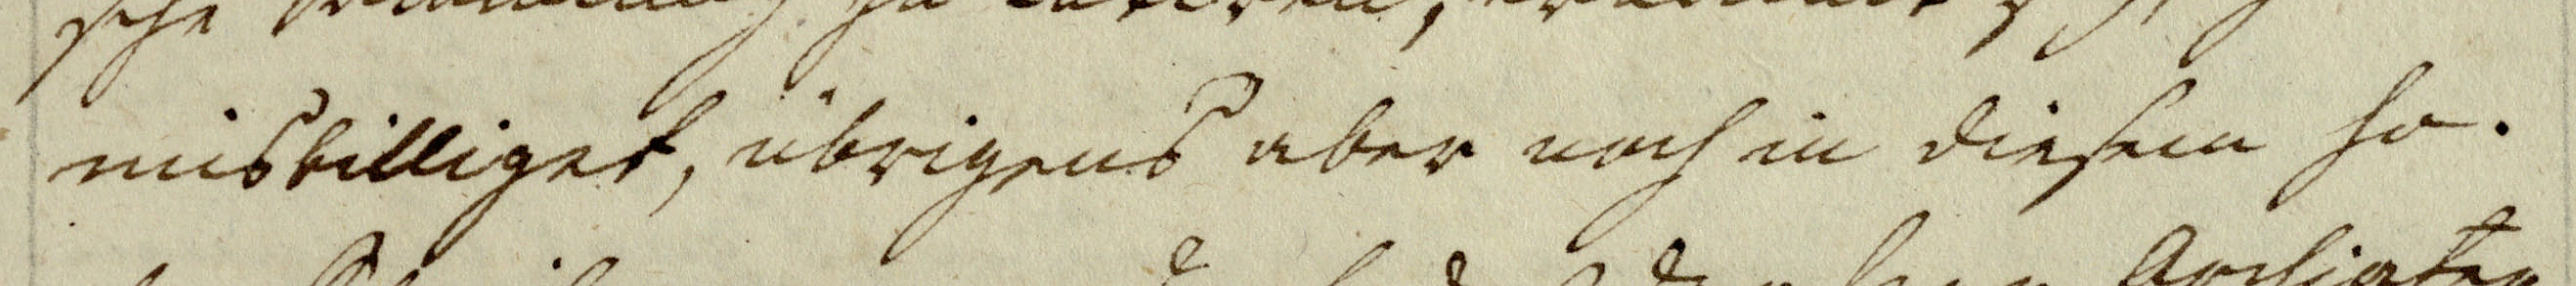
misbilliget, übrigens aber noch in diesem ho¬
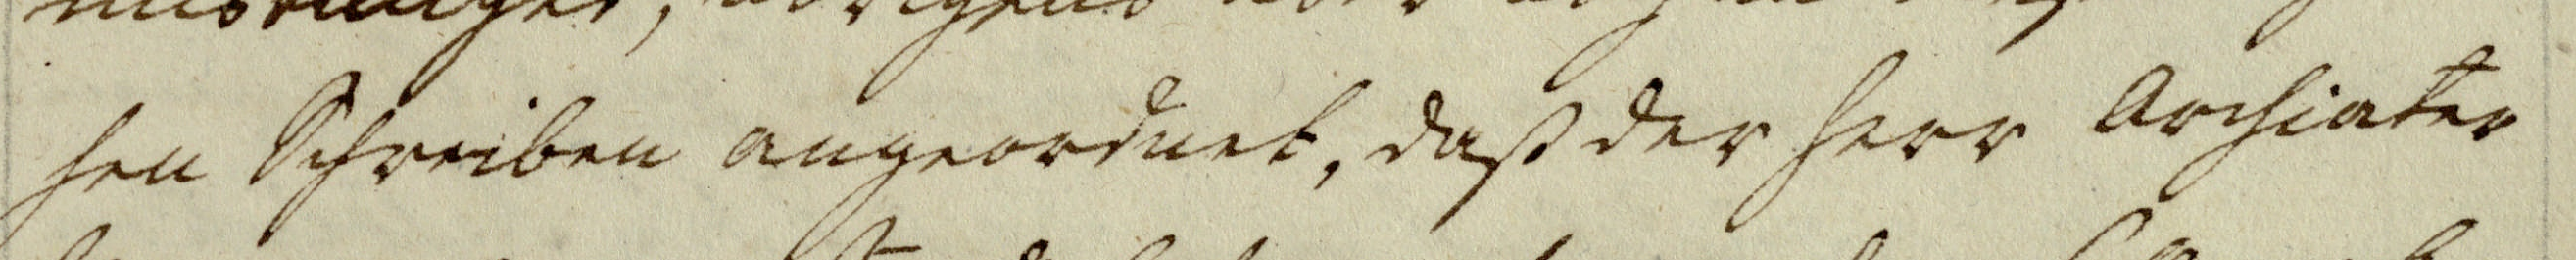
hen Schreiben angeordnet, daß der Herr Archiater
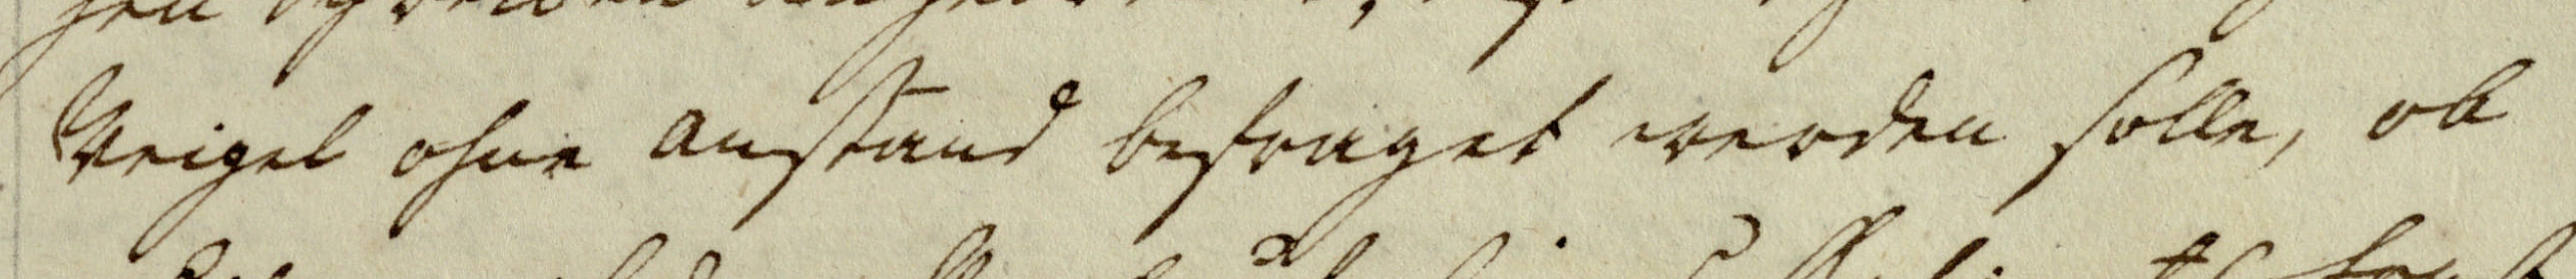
Weigel ohne Anstand befraget werden solle, ob
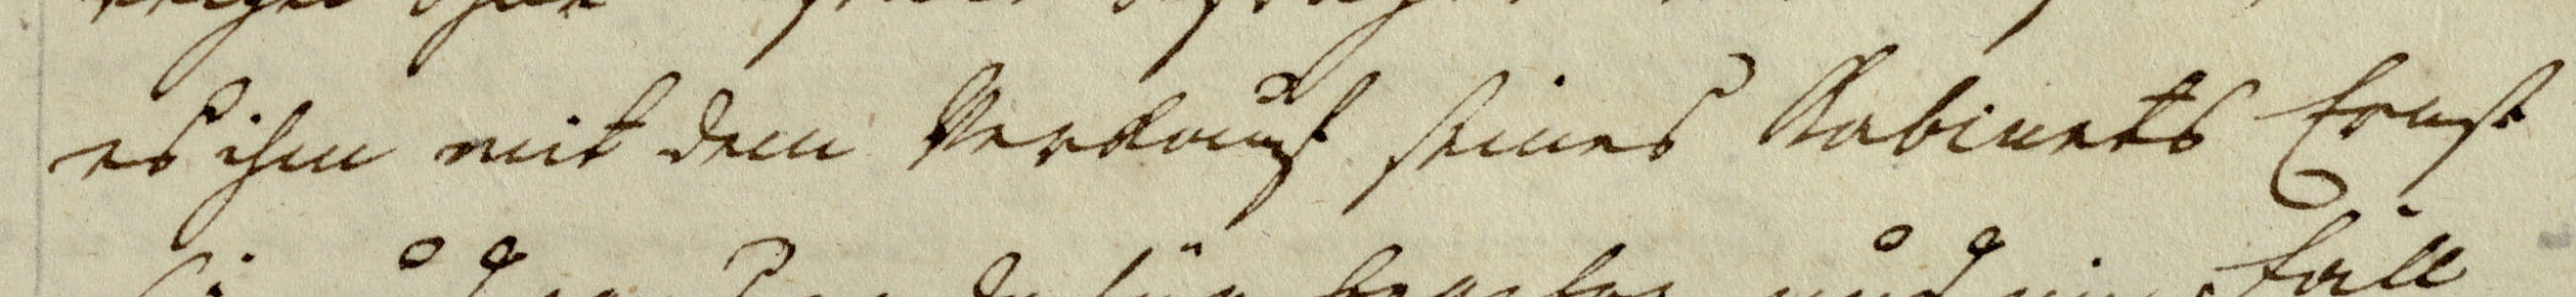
es ihm mit dem Verkauf seines Kabinets Ernst
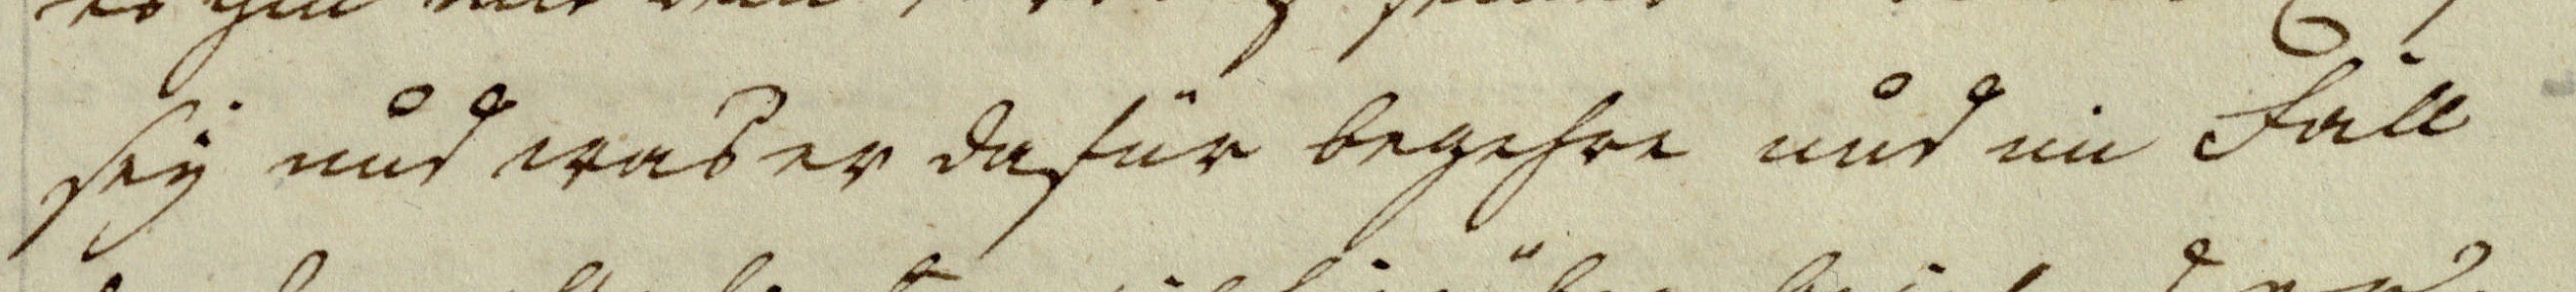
seÿ und was er dafür begehre und im Fall
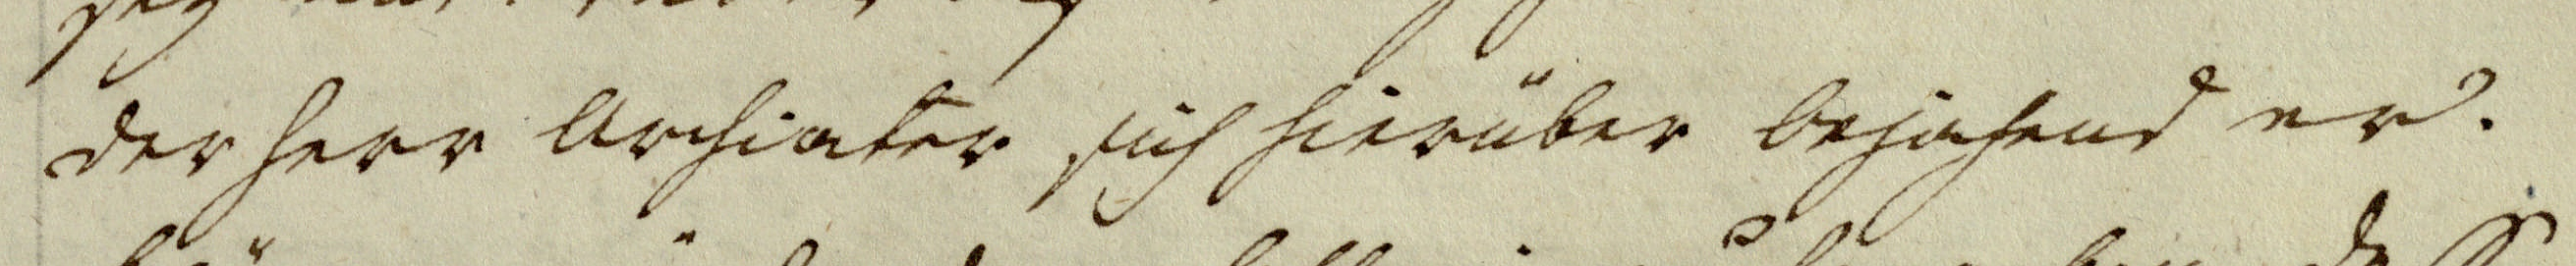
der Herr Archiater sich hierüber bejahend er¬
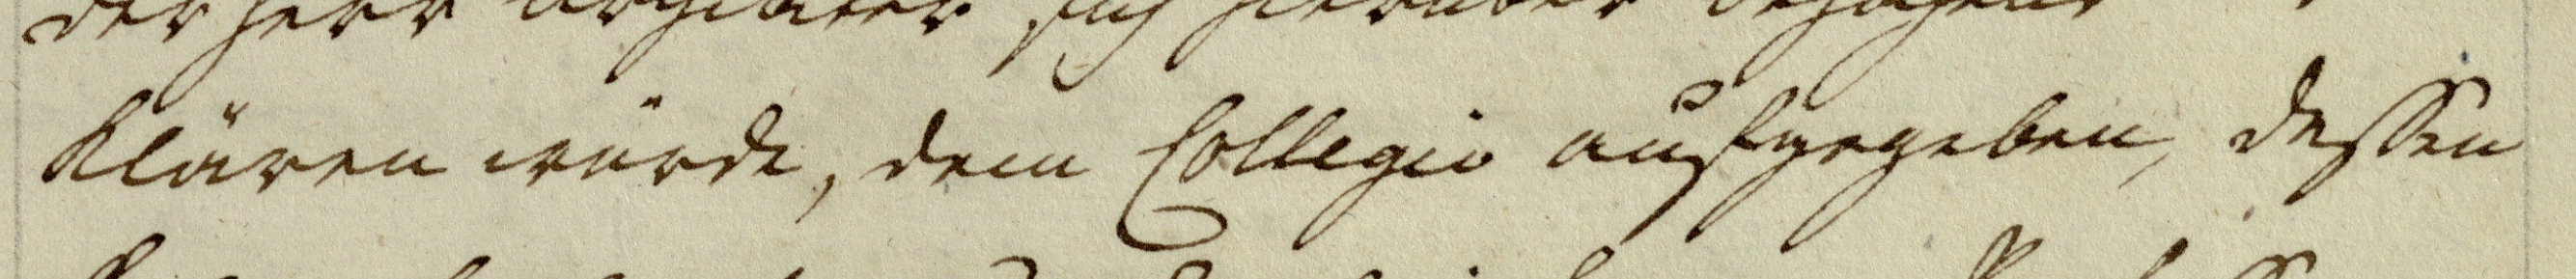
klären würde, dem Collegio aufgegeben, dessen
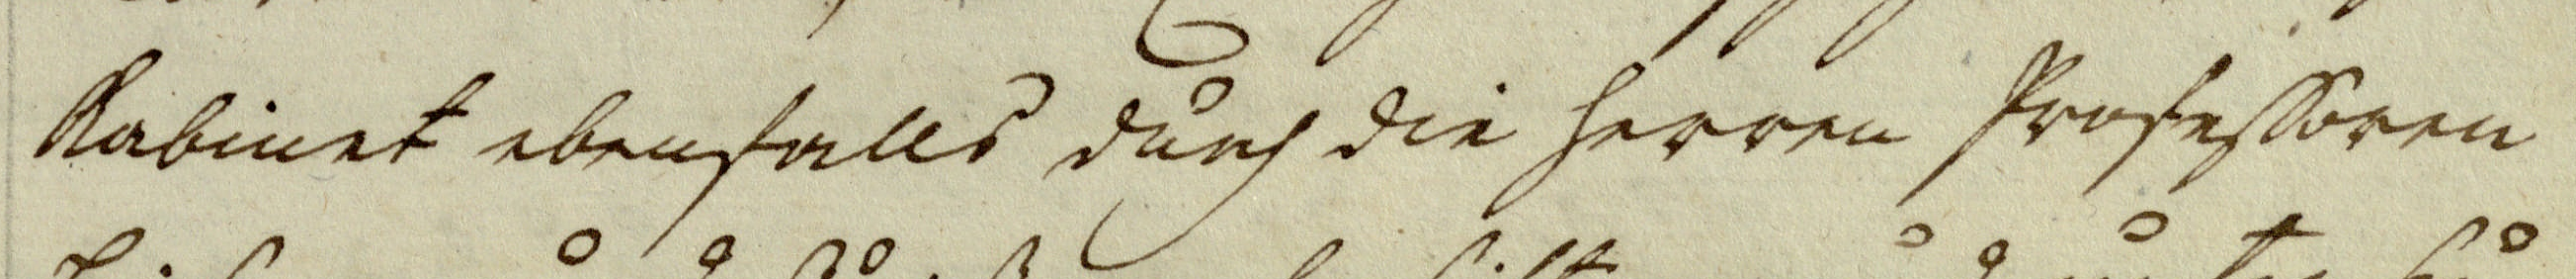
Kabinet ebenfalls durch die Herren Professoren
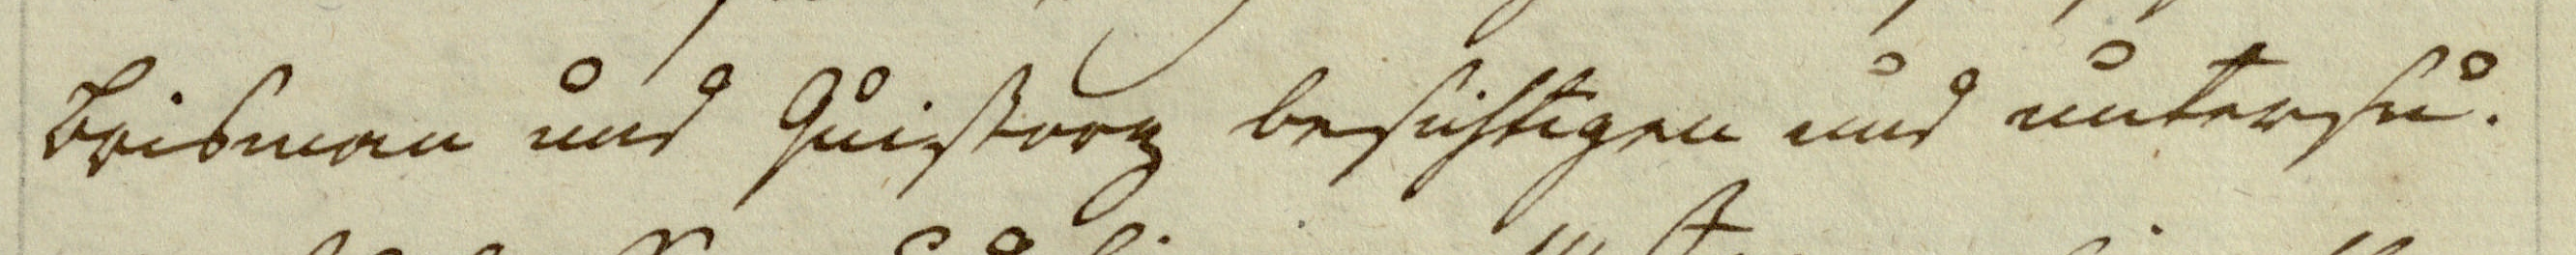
Brisman und Quistorp besichtigen und untersu¬
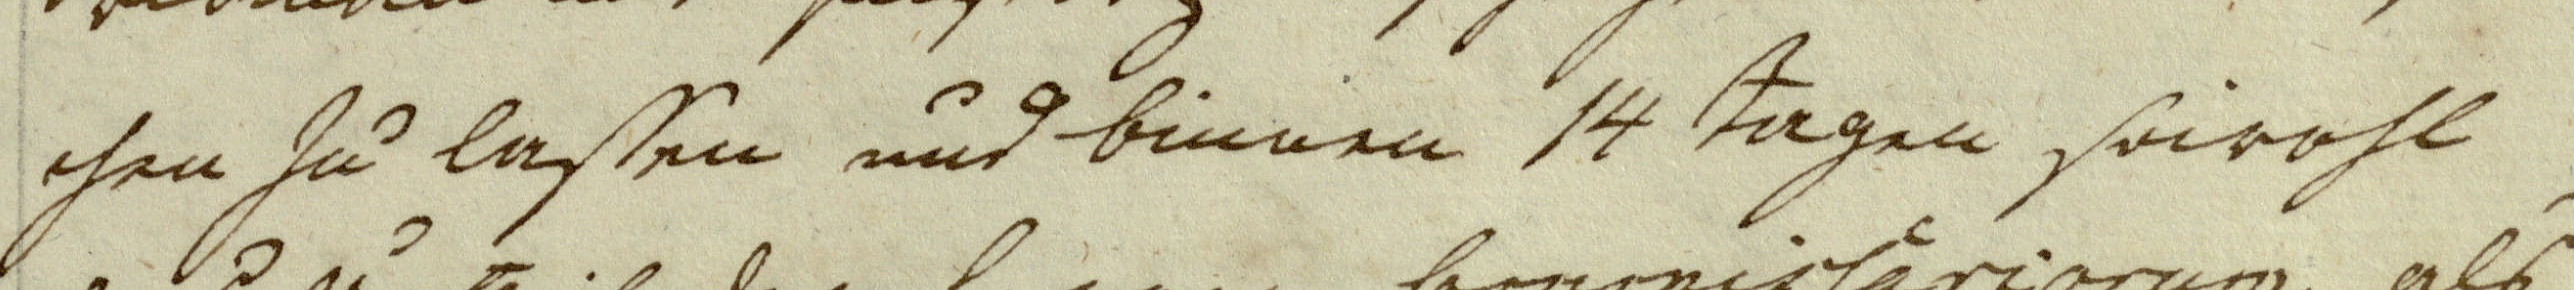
chen zu lassen und binnen 14 Tagen sowohl
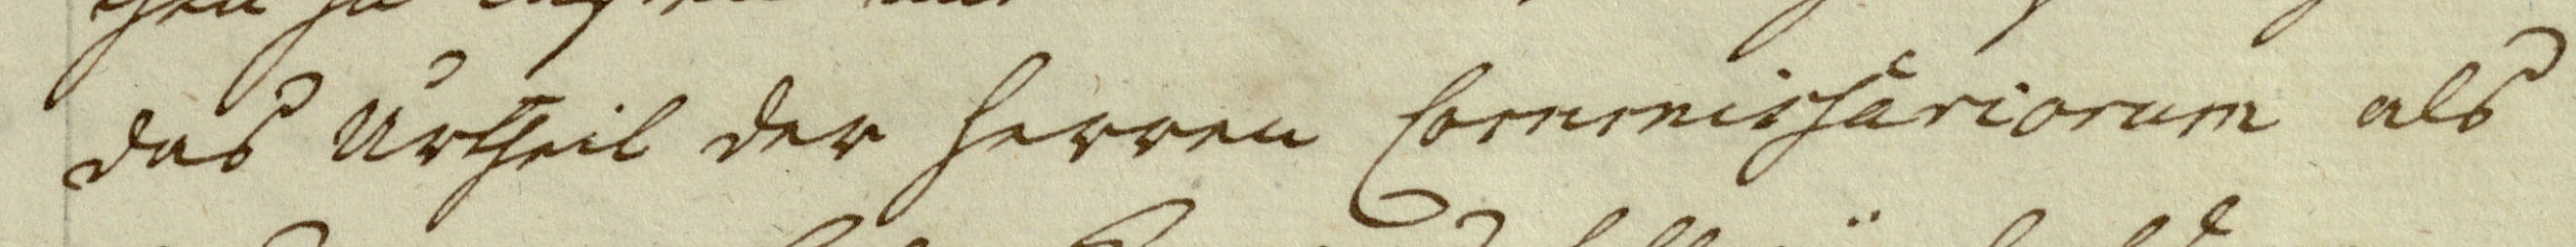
das Urtheil der Herren Commissariorum als
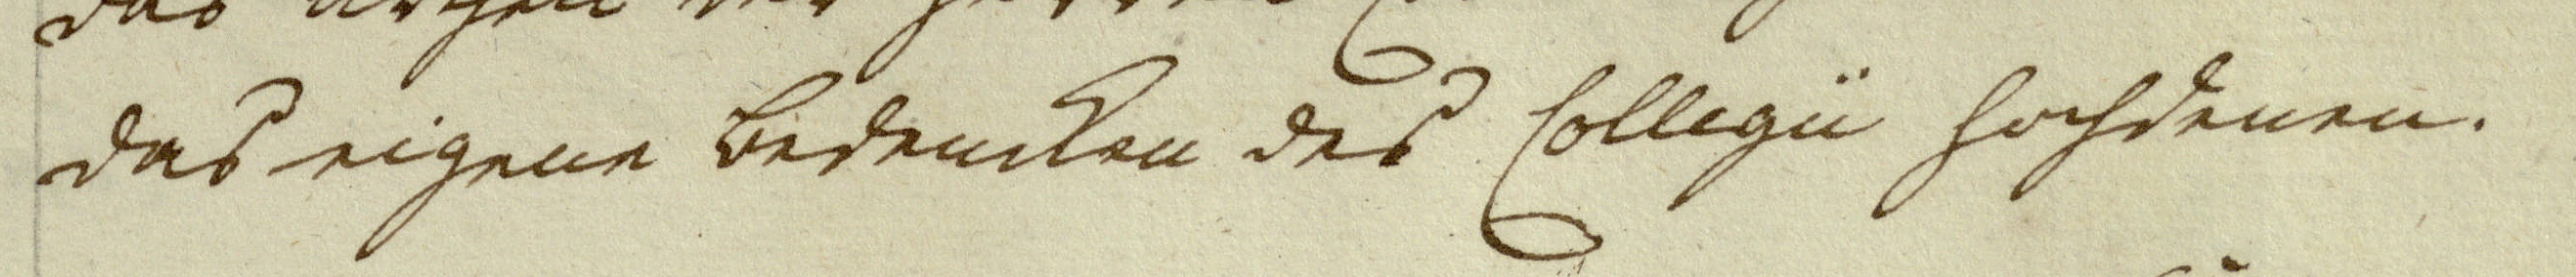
das eigene Bedencken des Collegii Hochdenen¬
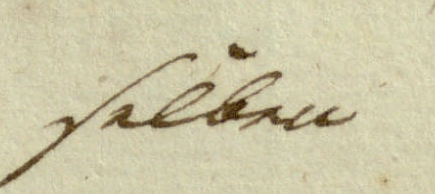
selben
